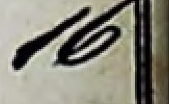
16
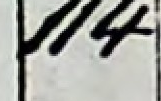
114
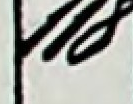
118
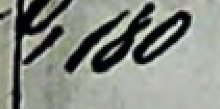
0,180
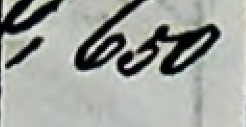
0,650
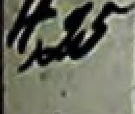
4,25
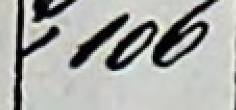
0,106
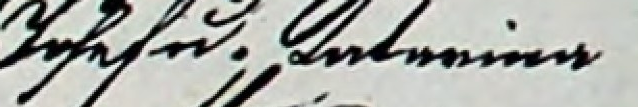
Josef u. Katarina
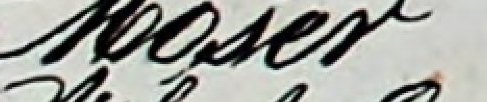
Moser
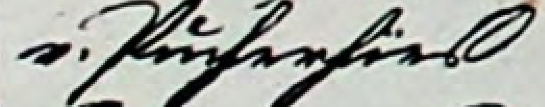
v. Pucherhirs
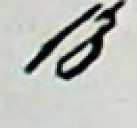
18
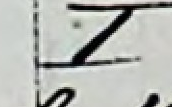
I
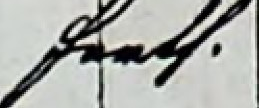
Forts.
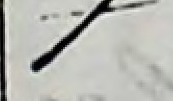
7
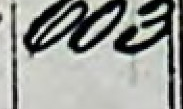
603
